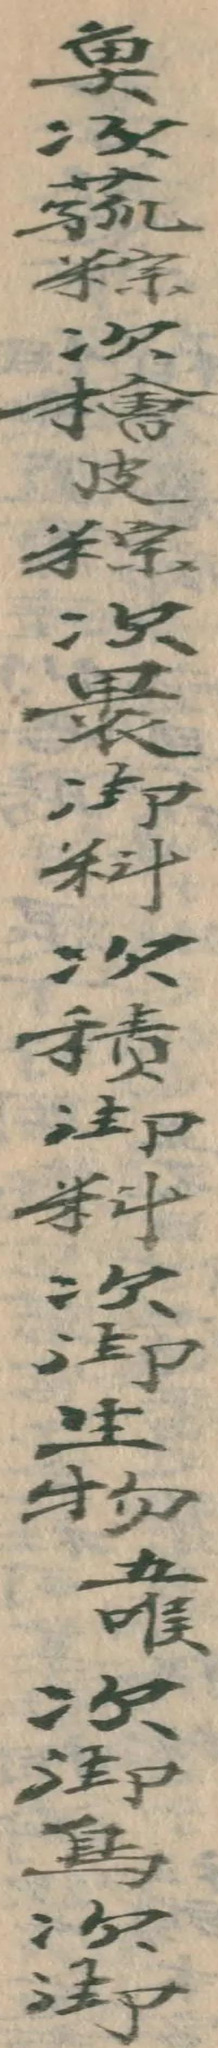魚次菰粽次桧皮粽次褁御料次積御料次御生物五喉次御鳥次御
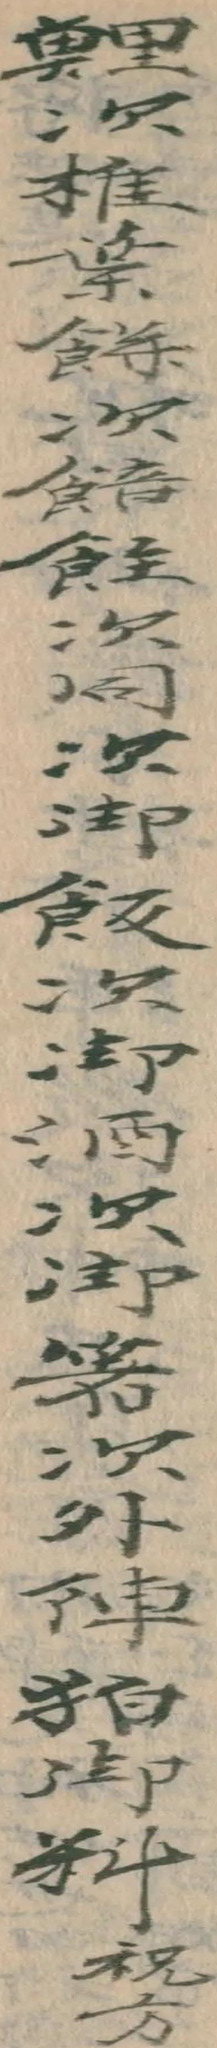鯉次椎葉餅次餢飳次同次御飯次御酒次御箸次外陣狛御料祝方
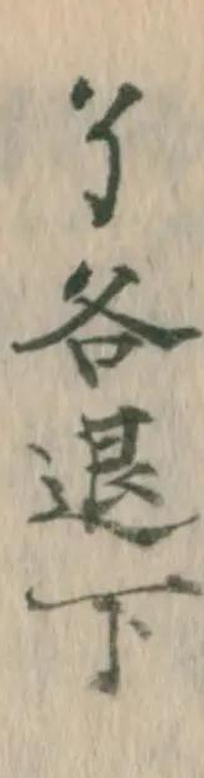了各退下

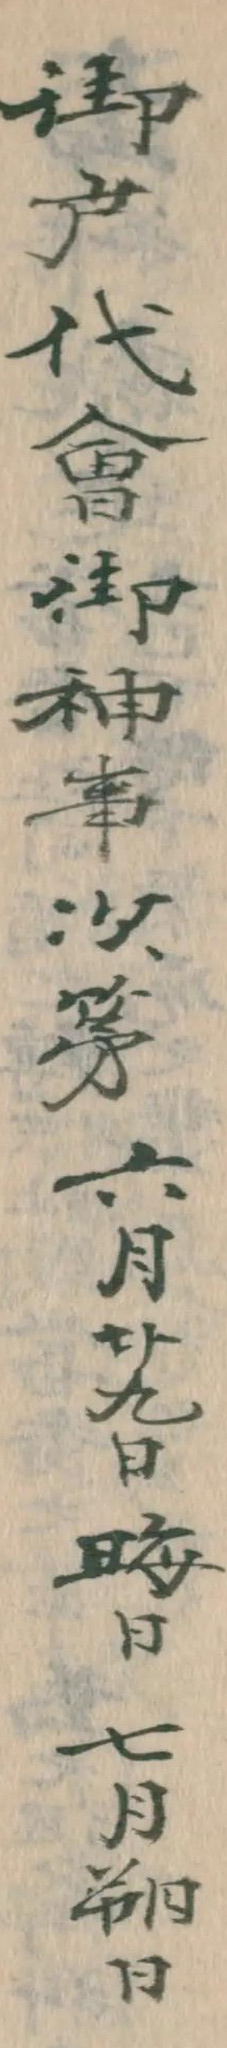御戸代会御神事次第六月廿九日晦日七月朔日
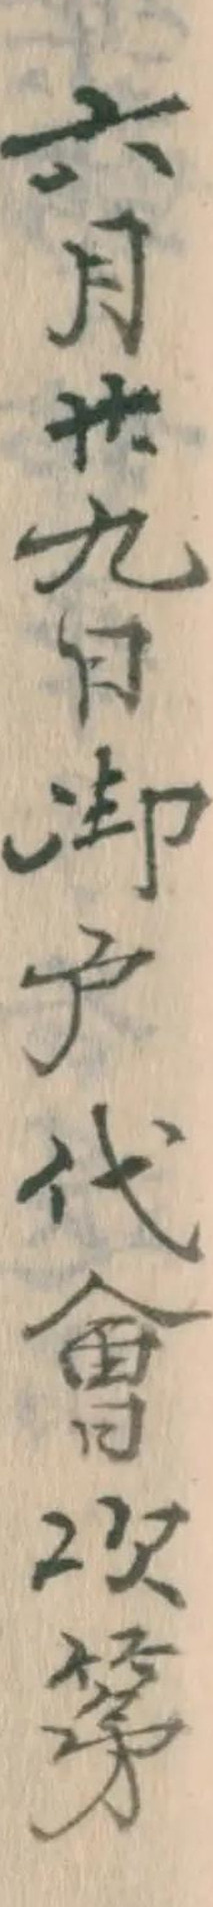六月廿九日御戸代会次第
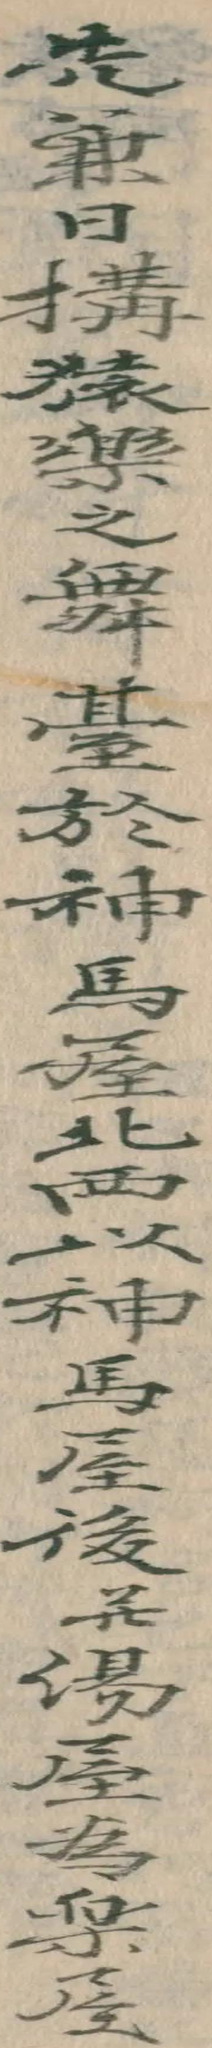先兼日搆猿楽之舞台於神馬屋北西以神馬屋後并湯屋為楽屋

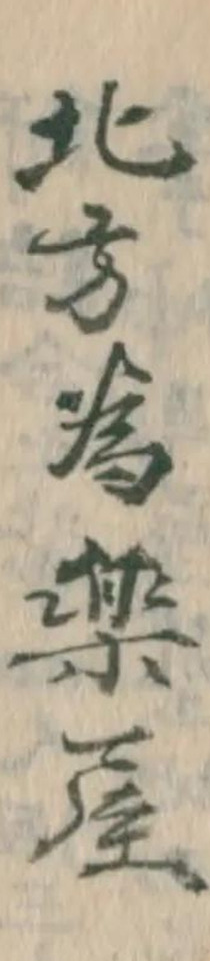北方為楽屋
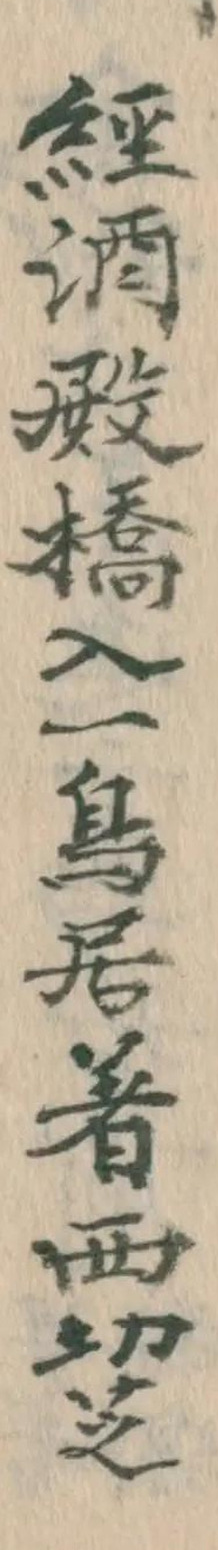経酒殿橋入一鳥居着西切芝
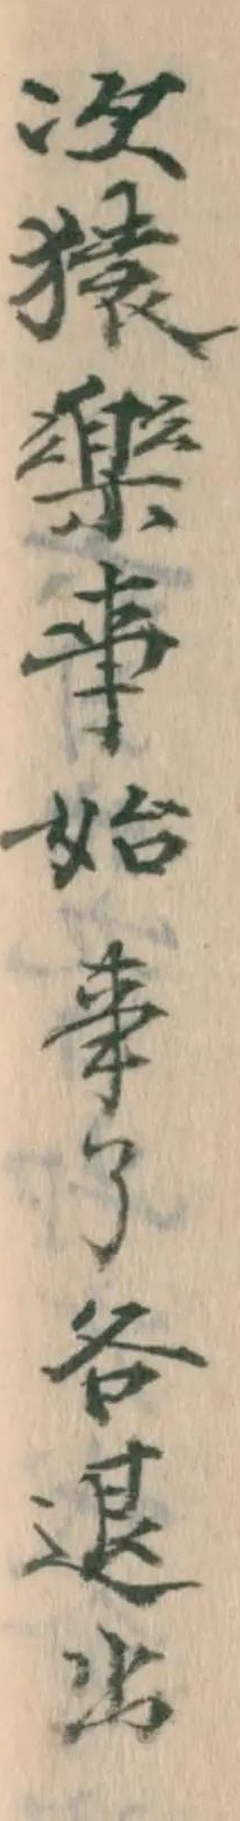次猿楽事始事了各退出
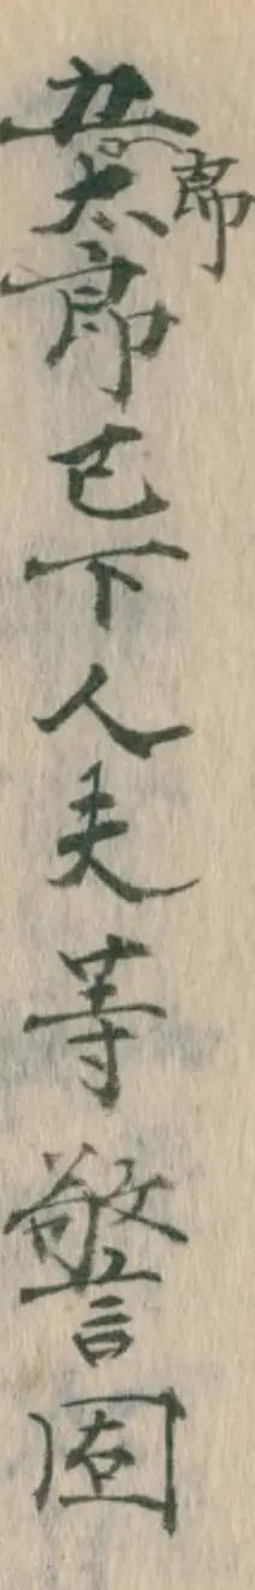五◦太郎已下人夫等警固
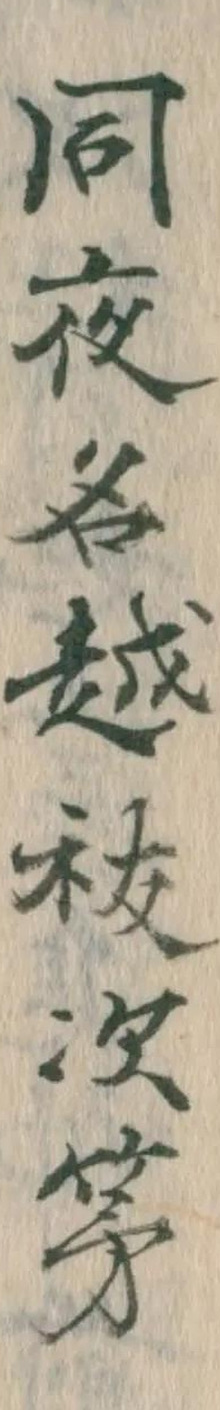同夜名越祓次第
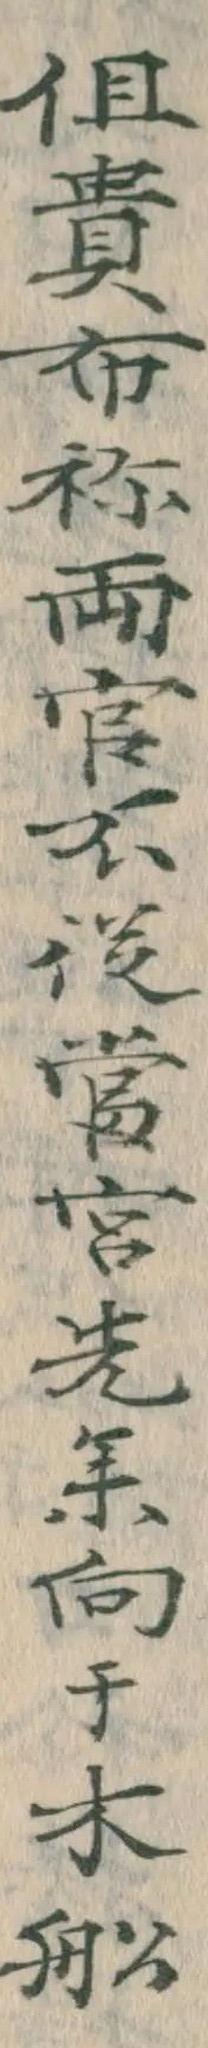但貴ふね両官不従当宮先参向于木船
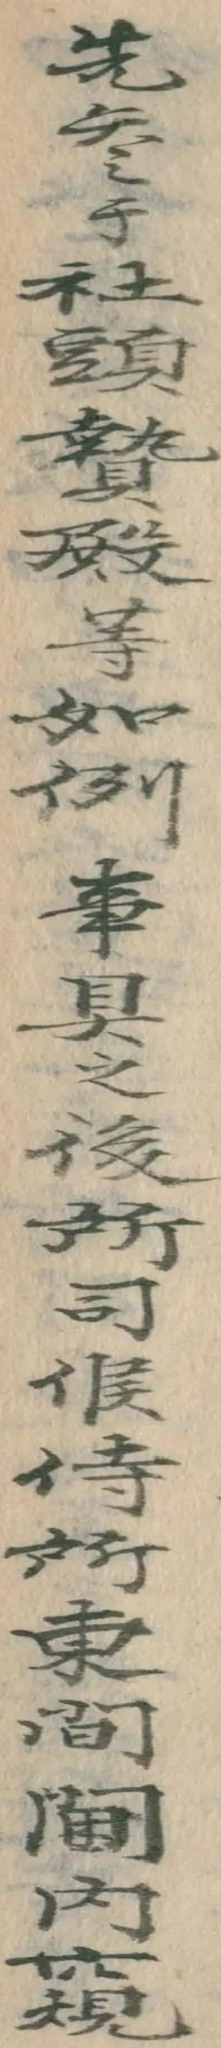先参于社頭贄殿等如例事具之後所司候侍所東間閫内窺

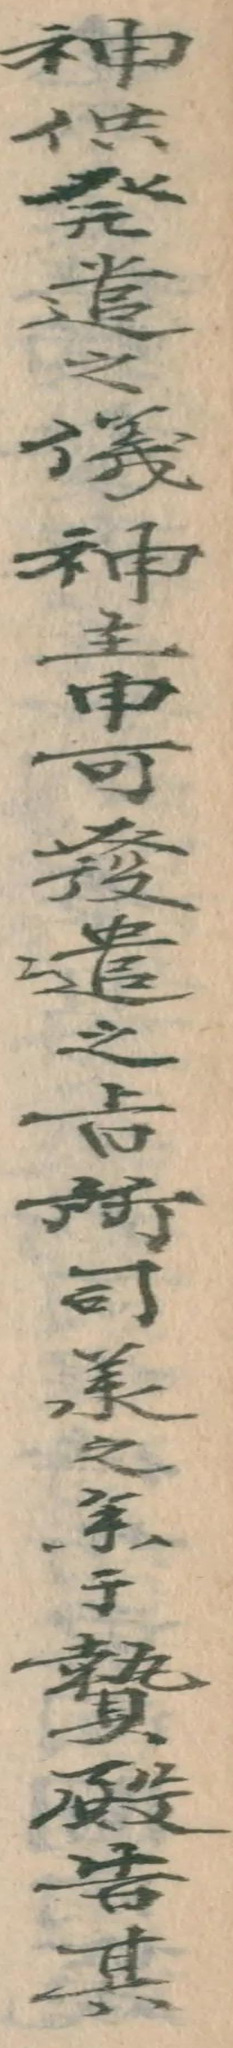神供発遣之儀神主申可発遣之旨所司承之参于贄殿告其
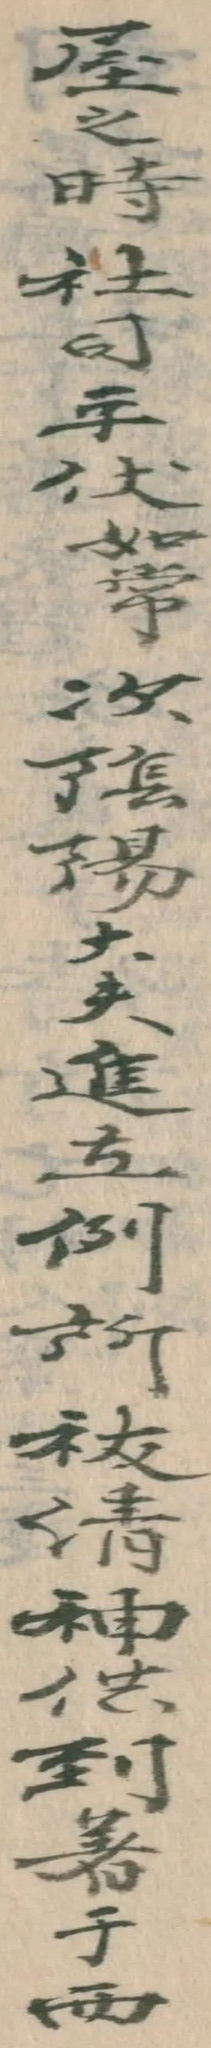屋之時社司平伏如常次陰陽大夫進立例所祓清神供到着于西
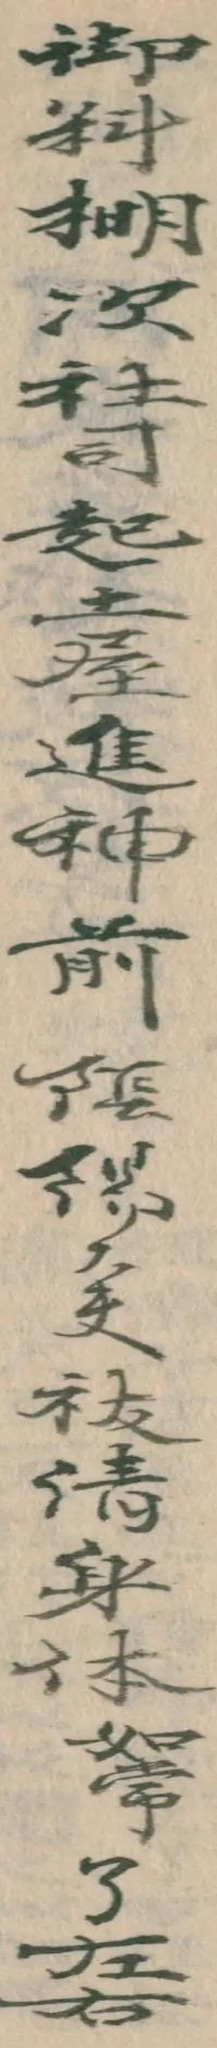御料棚次社司起土屋進神前陰陽大夫祓清身体如常了左右
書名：賀茂社記録. 第9冊
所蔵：国立国会図書館 National Diet Library, JAPAN
